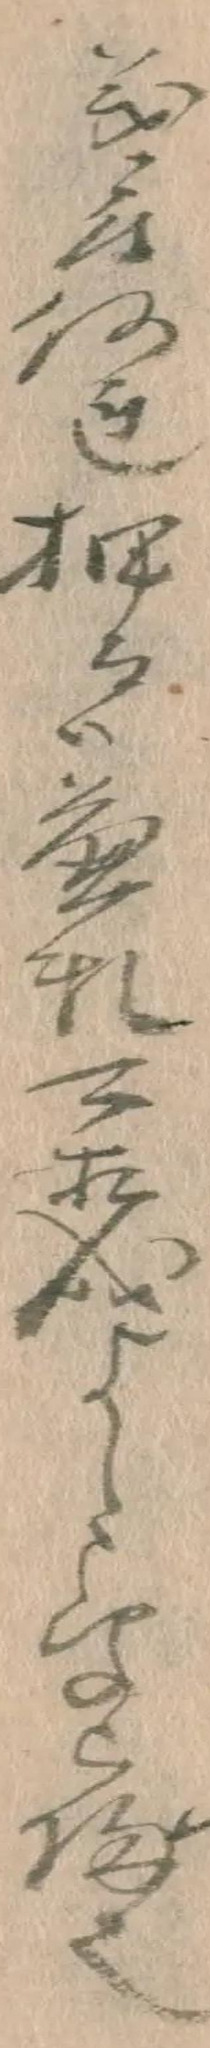義ニ付何れ押而御兼料可相成よし申聞被致也
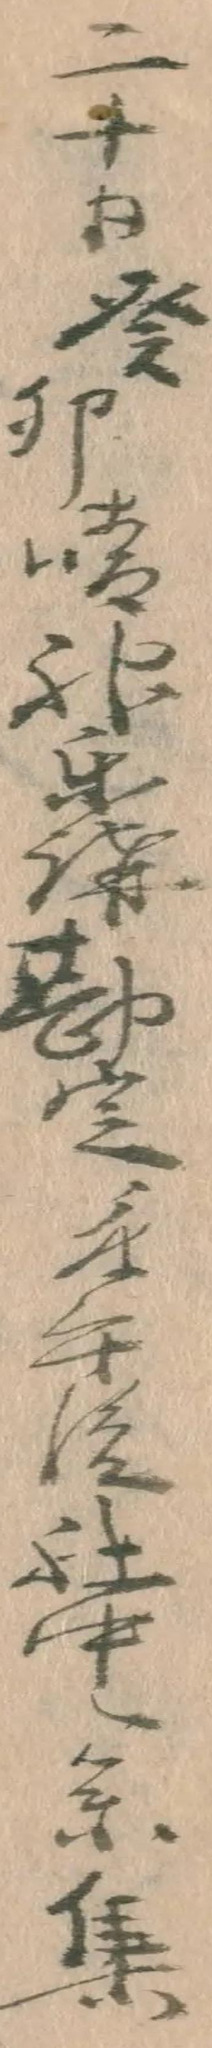二十日癸卯晴神楽講勘定ニ付午後社中へ参集
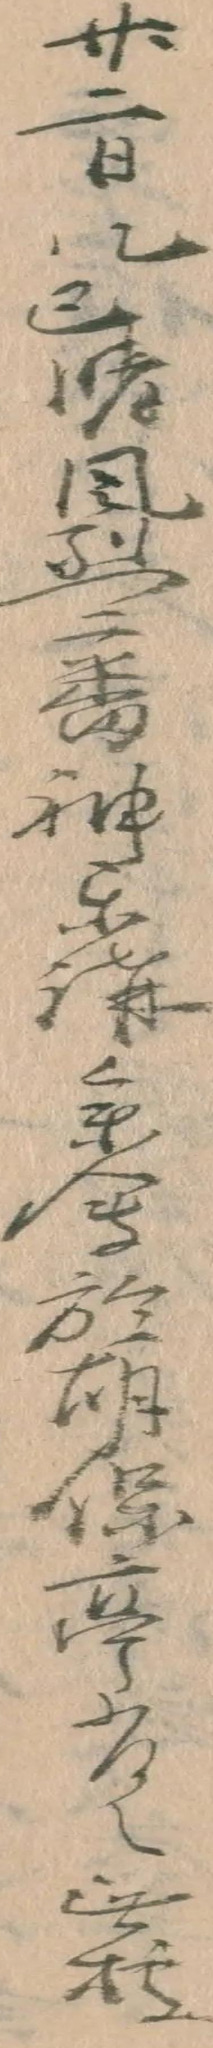廿二日乙巳晴風烈二番神楽講参會於胡保亭有之無数
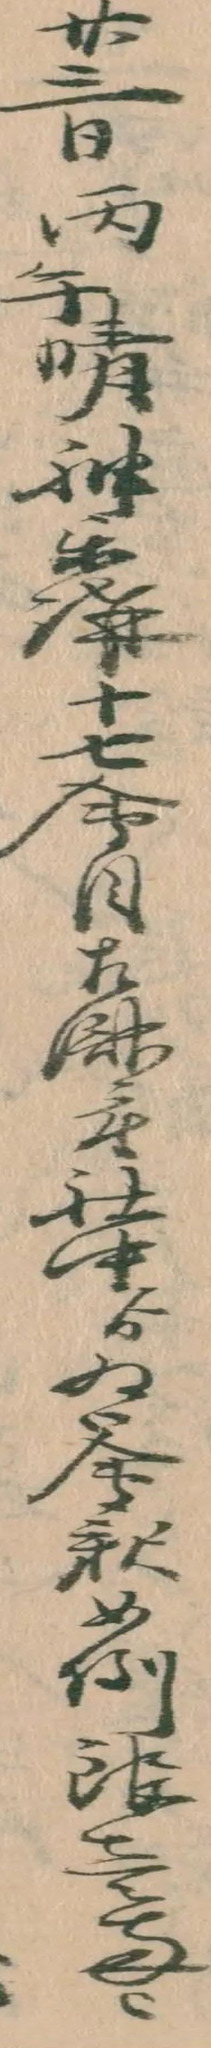廿三日丙午晴神楽講十七會目相済ニ付社中ゟ為御會釈如例銀壱両被
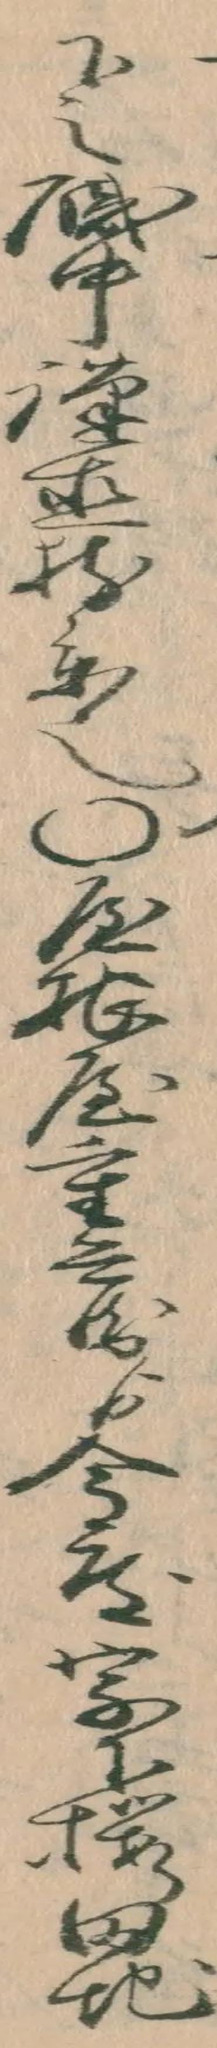下之職中謹直持参也○屋敷屋重兵衛ゟ今度字下桜田地
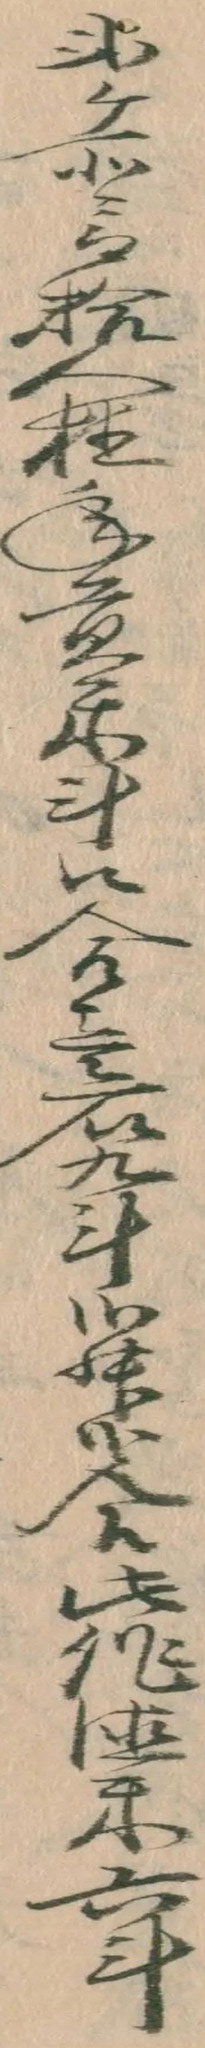弐ケ所ニ而拾人年貢米斗口合壱石九斗弐升弐合此作徳米六斗
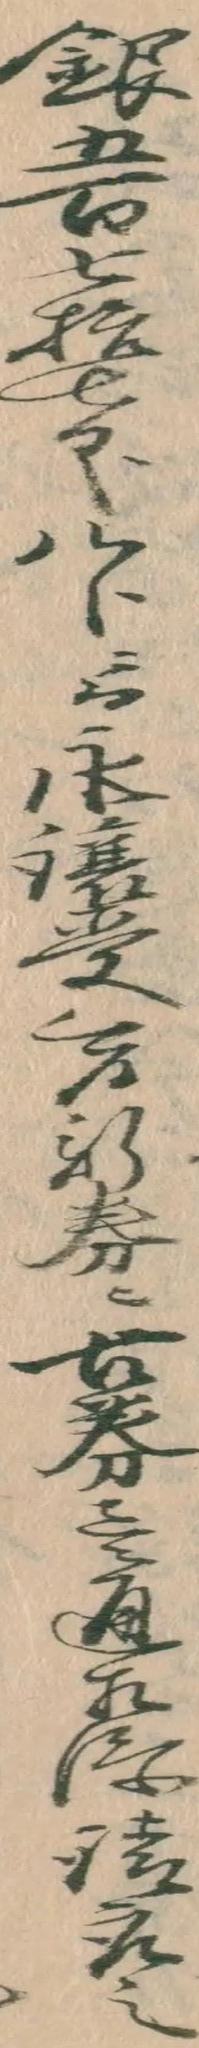銀五百七拾七匁八分ニ而永譲受旁新券ニ古券壱通相添請取之
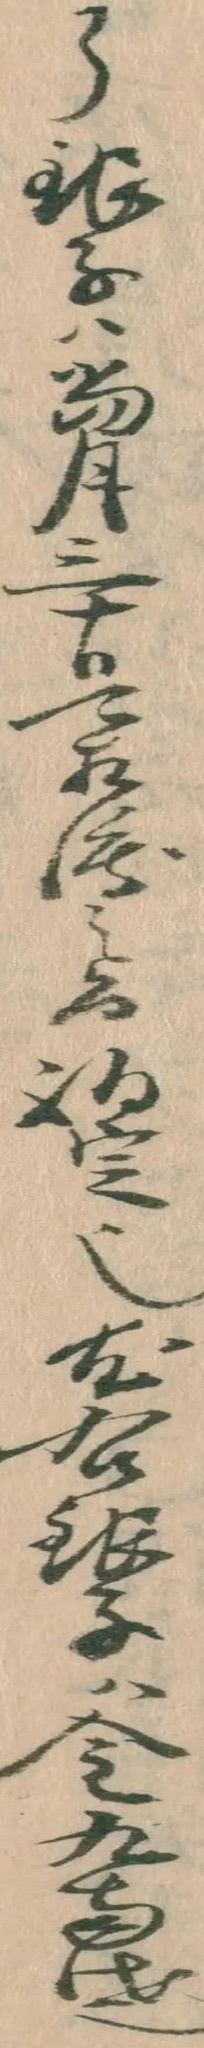了銀子ハ當月三十日可相渡之旨約定也尤右銀子ハ金九両代也
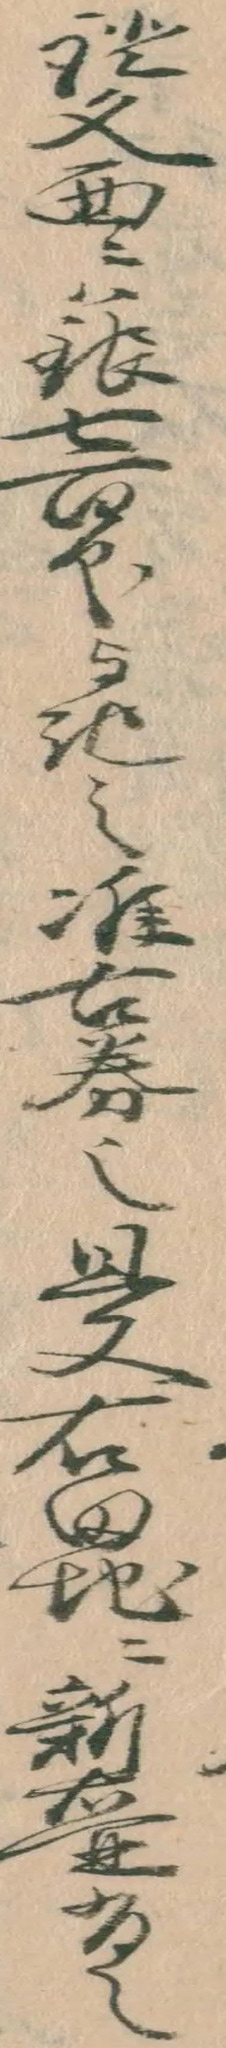證文面には銀七百申と記之准古券也且又右田地に新壷有之
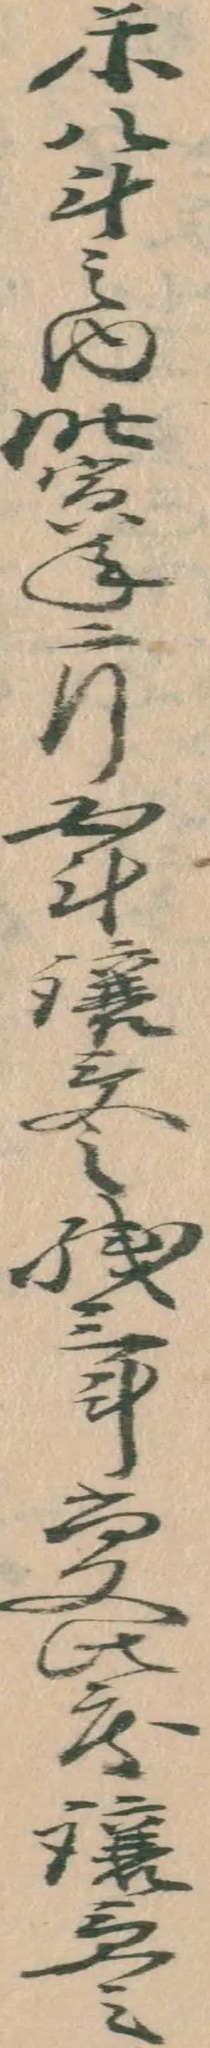米八斗之内昨寅年二引五斗ニ譲受之銭三斗尚又此度譲受之
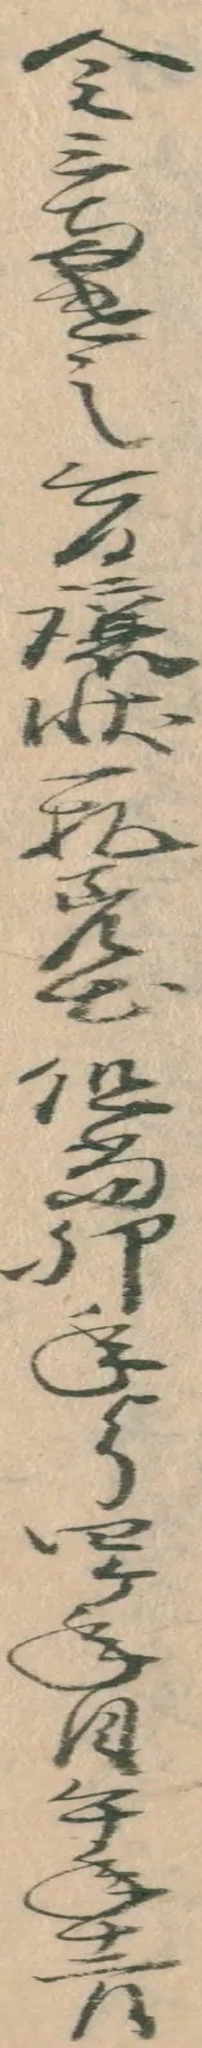金三両遣也今日譲状一札差出但當卯年より四ケ年月午年十二月
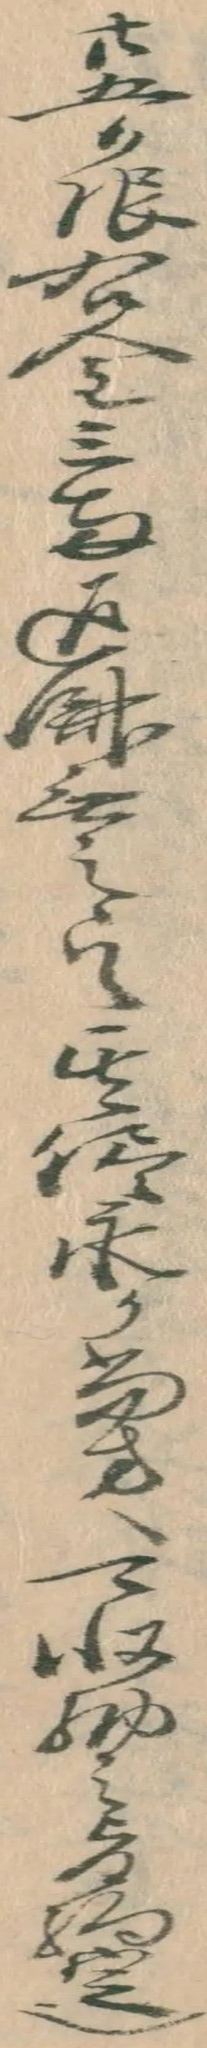廿五日限右金三両返済無之候ハヽ其侭承り當方へ可収納之旨約定也
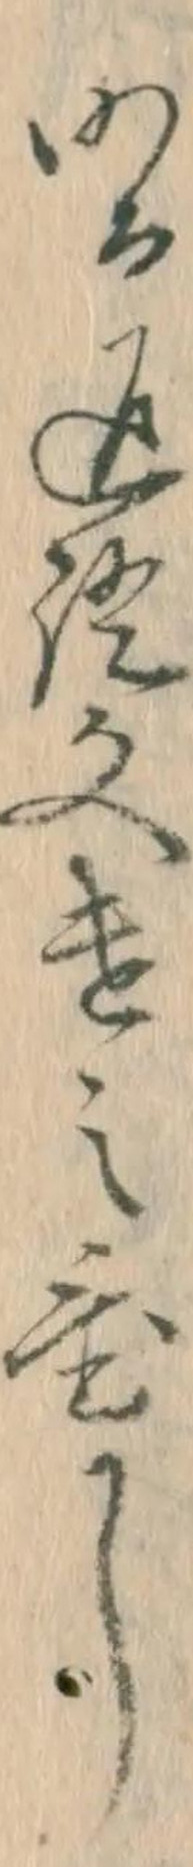仍而返證文遣之置了

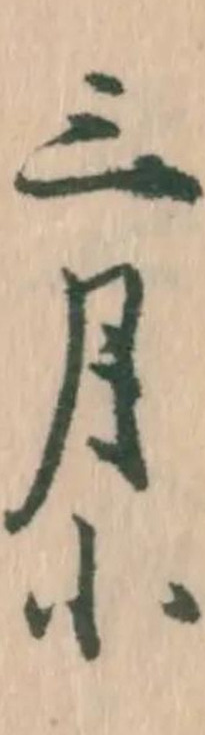三月小
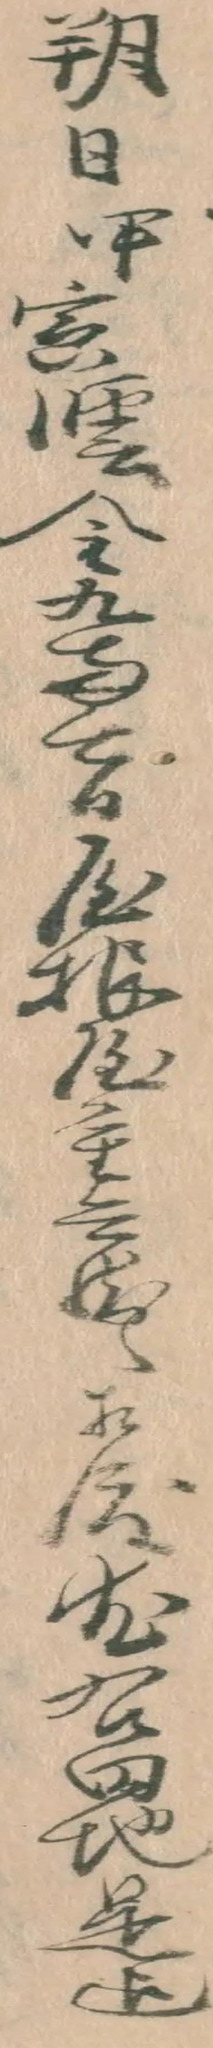朔日甲寅国曇金九両七日屋根屋重兵衛へ相渡尤右田地是迄
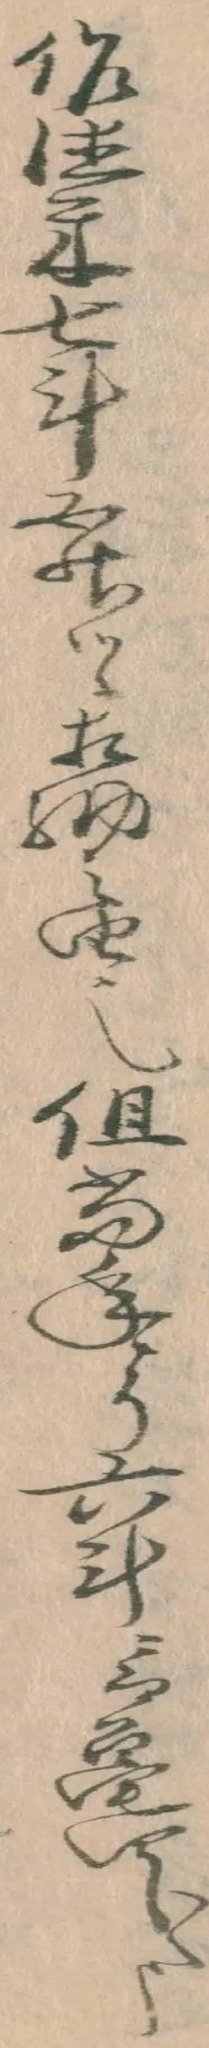作徳米七斗五升ツヽ相納之由也但當年より六斗ニ而亀四分申
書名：賀茂社記録. 第66冊
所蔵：国立国会図書館 National Diet Library, JAPAN
